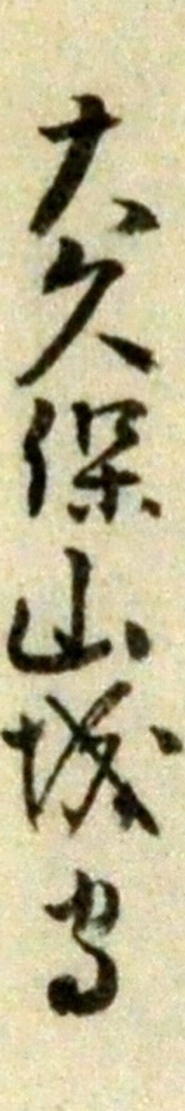大久保山城守
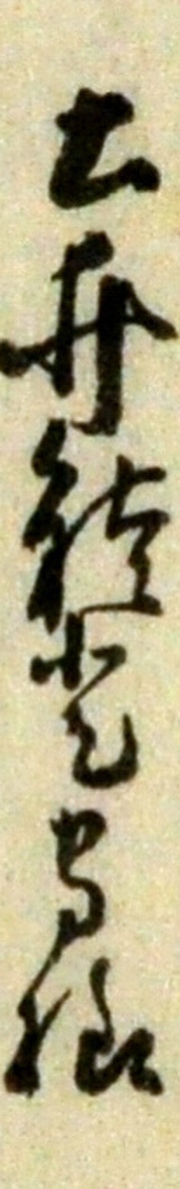土井能登守様
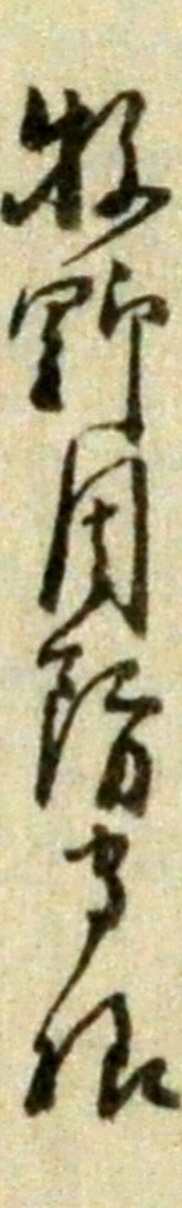牧野周防守様
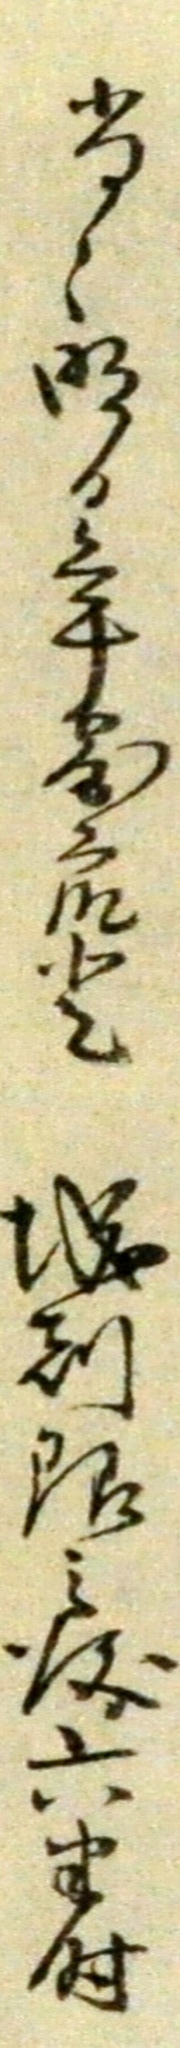尚々明日年寄衆登城刻限之儀六半時
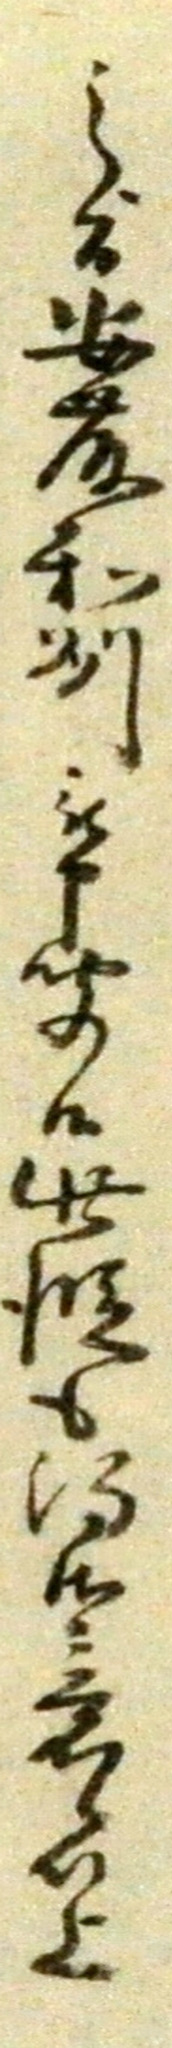之旨安藤和州被申聞候此段も得御意候以上
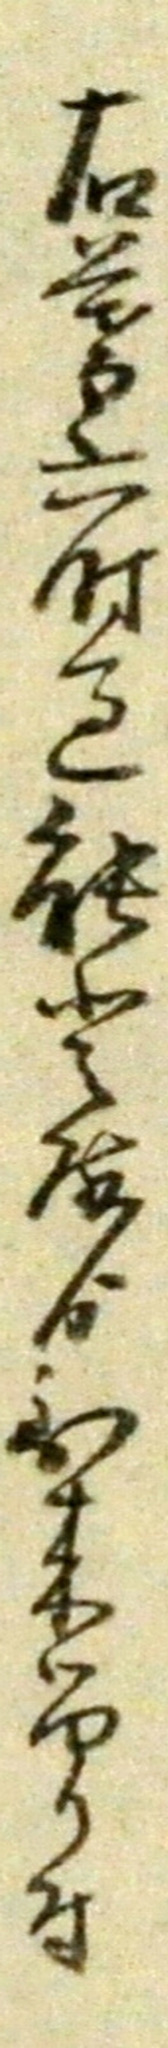右暮六時過能登殿ゟ到来留り付
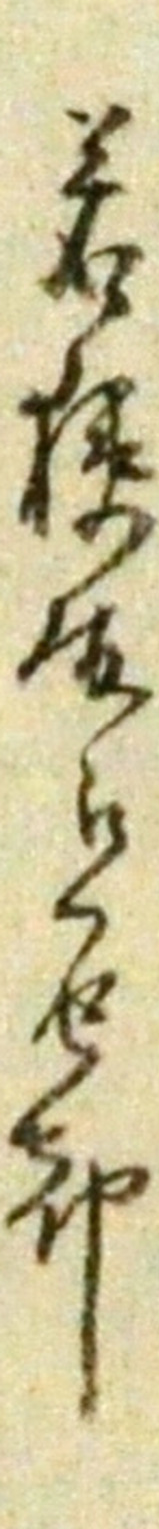若狭殿え返却
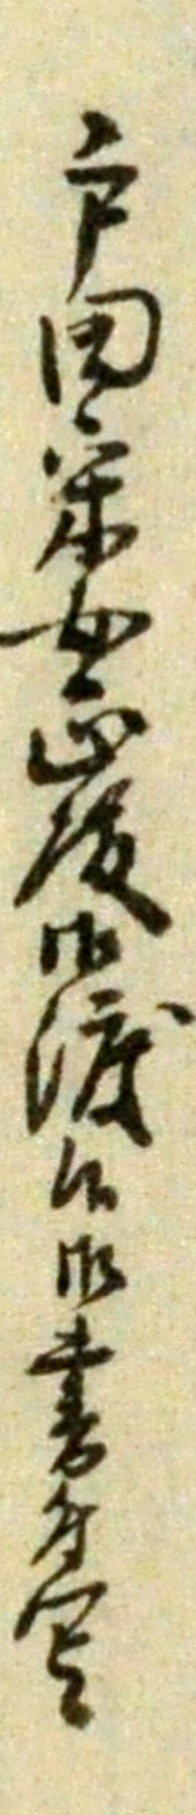戸田采女正殿御渡候御書付写
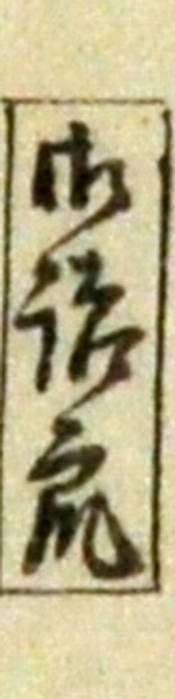御詰衆
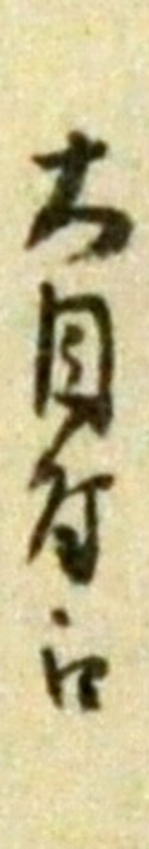大目付え

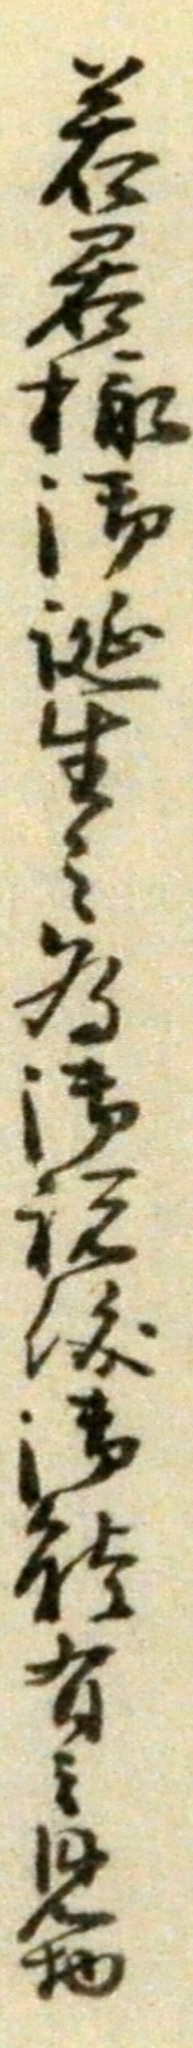若君様御誕生之為御祝儀御能有之見物
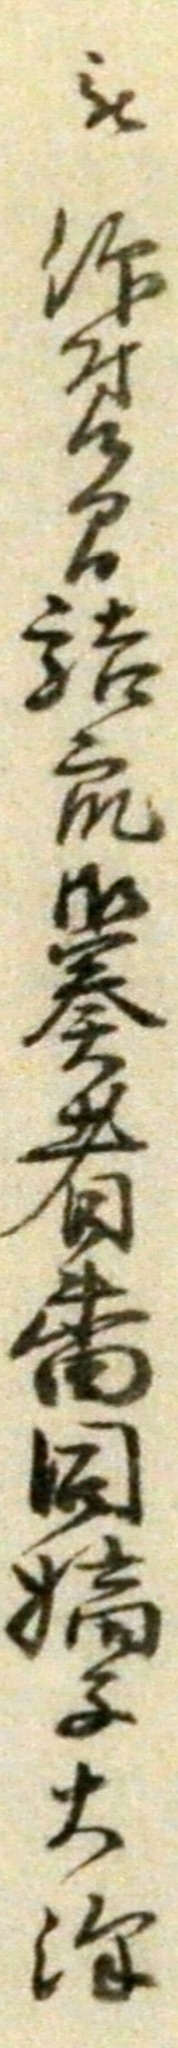被仰付候間詰衆御奏者番同嫡子大沢
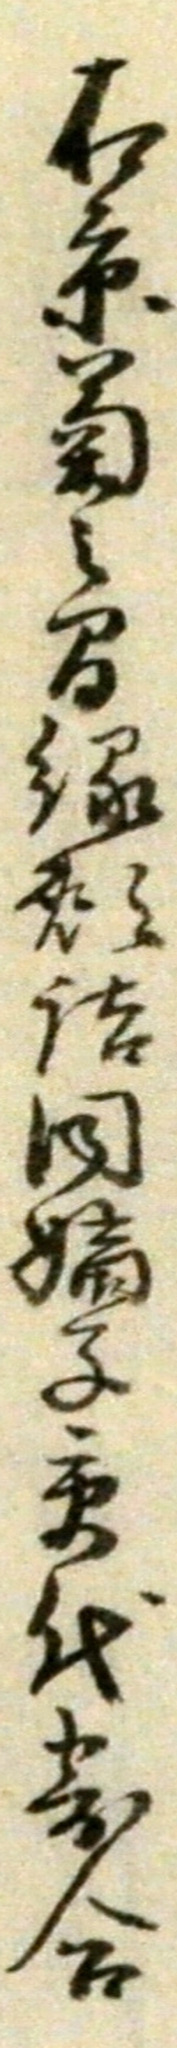右京菊之間縁頬詰同嫡子交代寄合
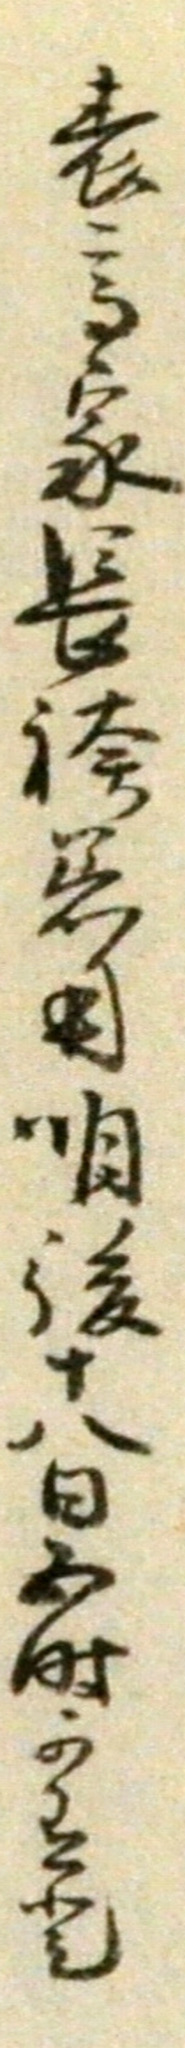表ニ而家長袴着明後後十八日五時可有登
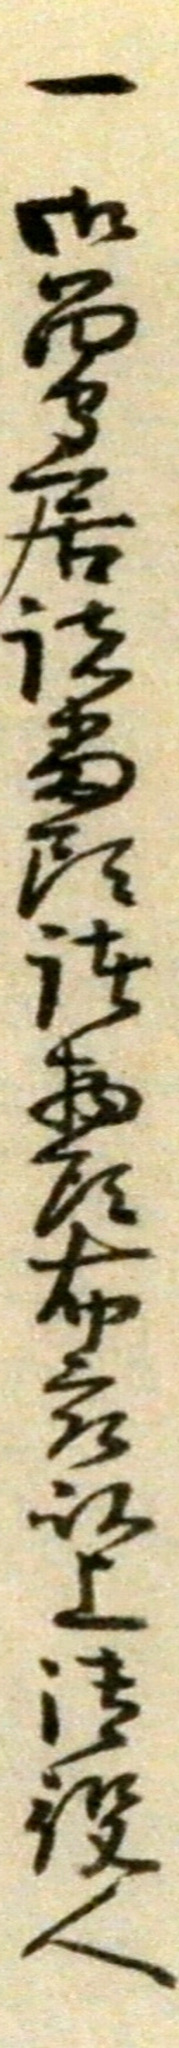一御留守居諸番頭諸物頭布衣以上御役人
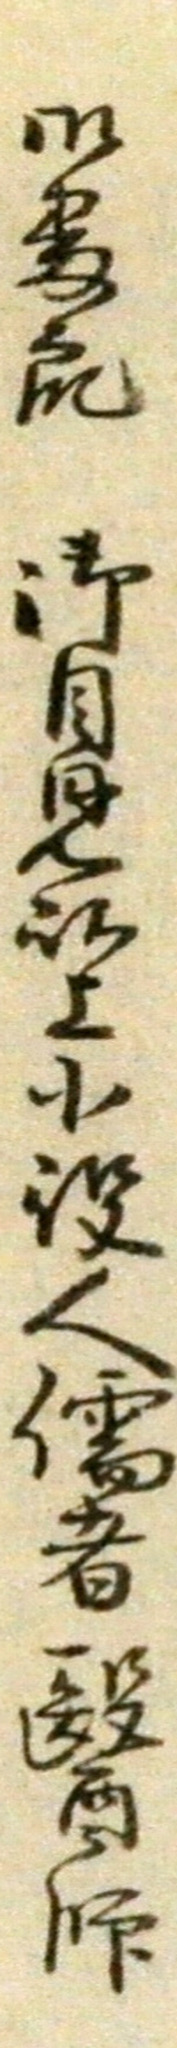御番衆御目見以上小役人儒者醫師
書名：若君様（家斉嫡男）誕生諸祝儀ノ節ノ留書外
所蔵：伊那市立高遠町図書館・合同会社AMANE
